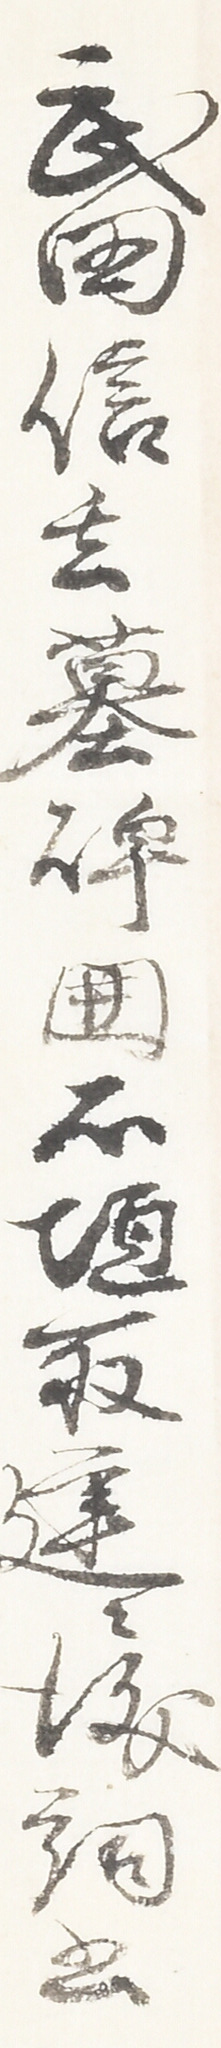武田信玄墓碑囲石垣取建之儀伺書
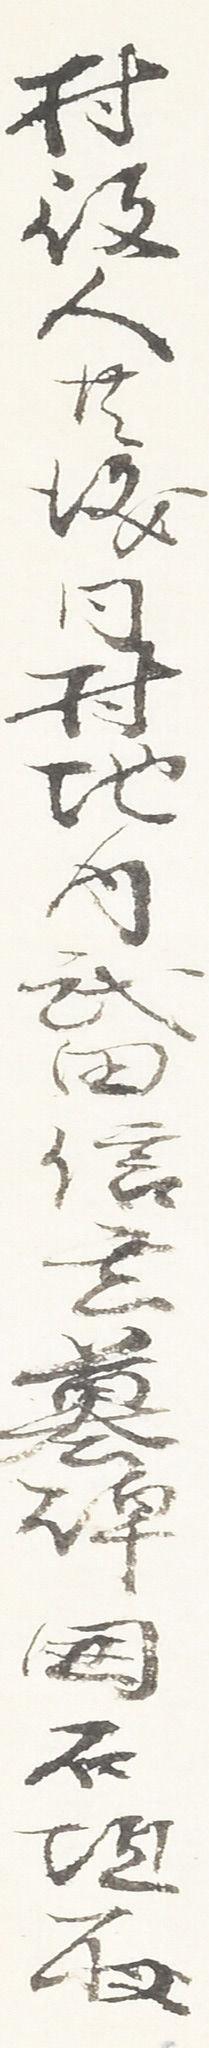村役人共儀同村地内武田信玄墓碑囲石垣取
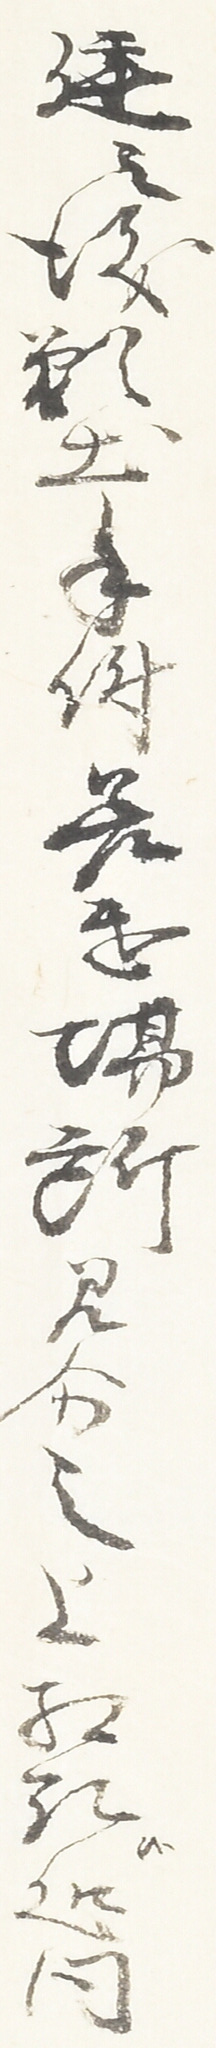建之儀願出手附差遣場所見分之上相糺候処同
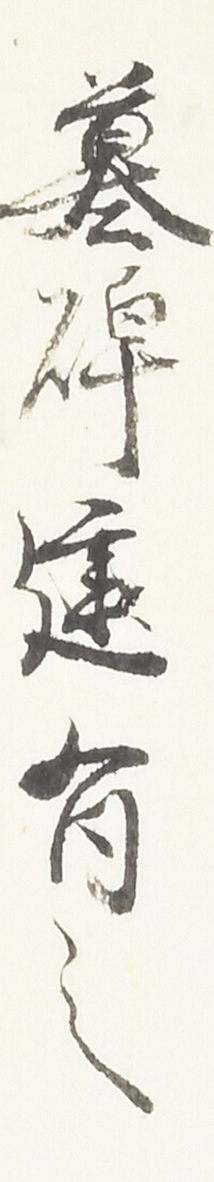墓碑建有之
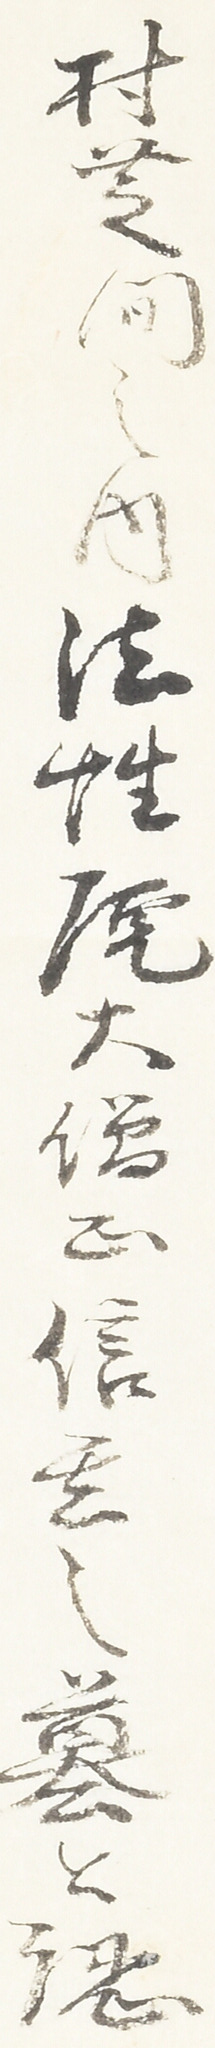村芝間之内法性院大僧正信玄之墓と認
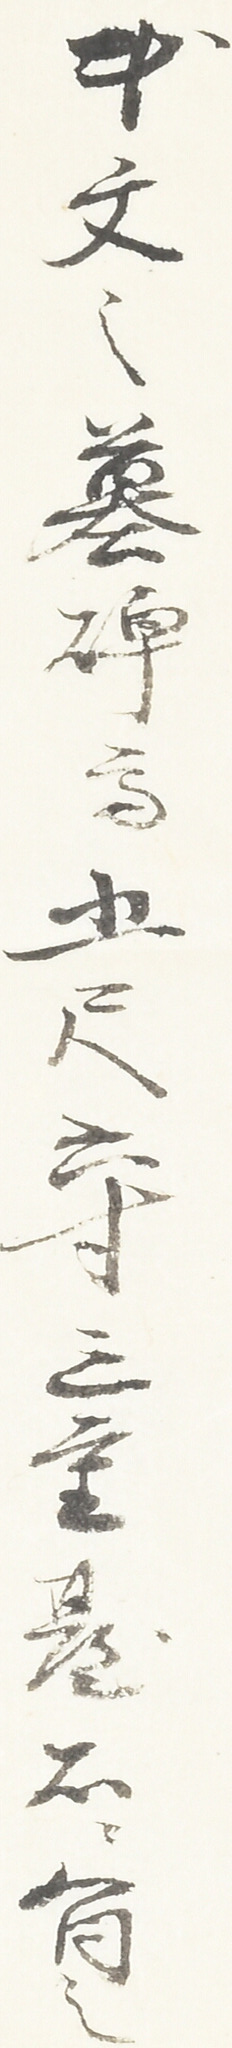本文之墓碑高五尺六寸三重台石ニ有之

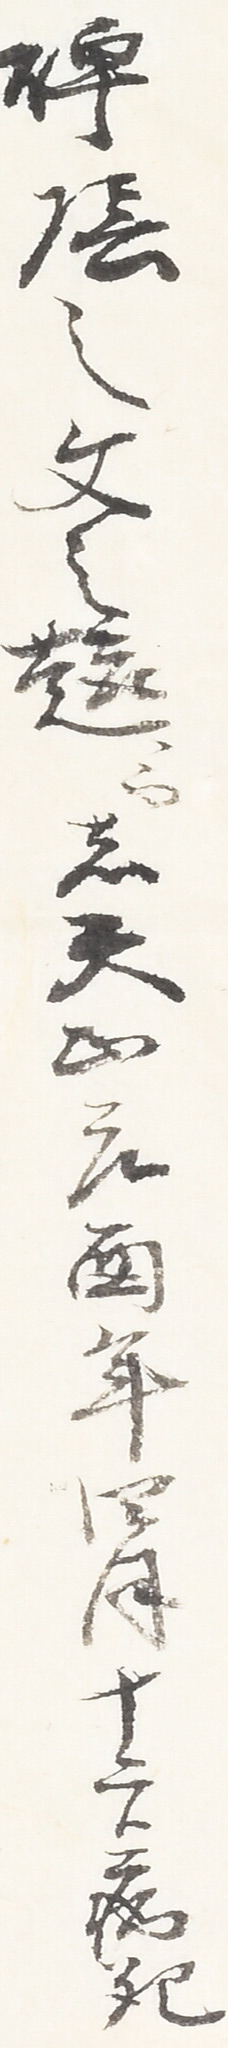碑陰之文之趣ニ而は天正元酉年四月十二日病死
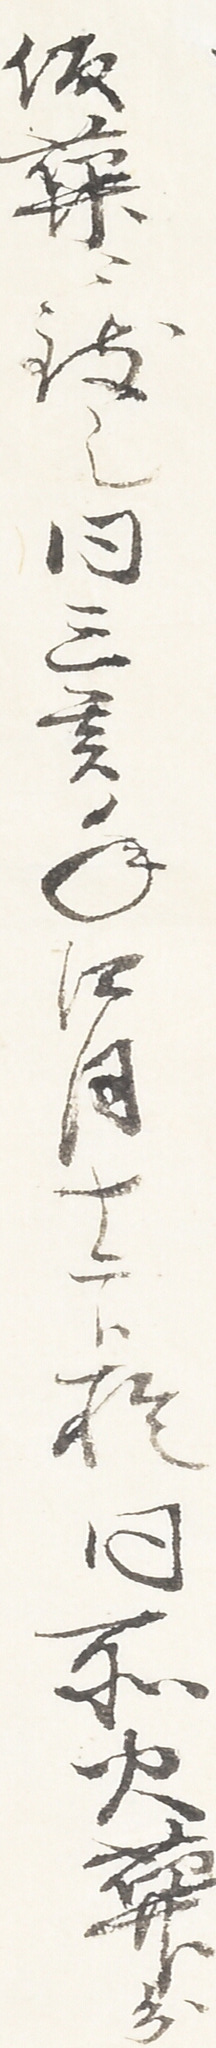仮葬ニ致し同三亥年四月十二日於同所火葬分
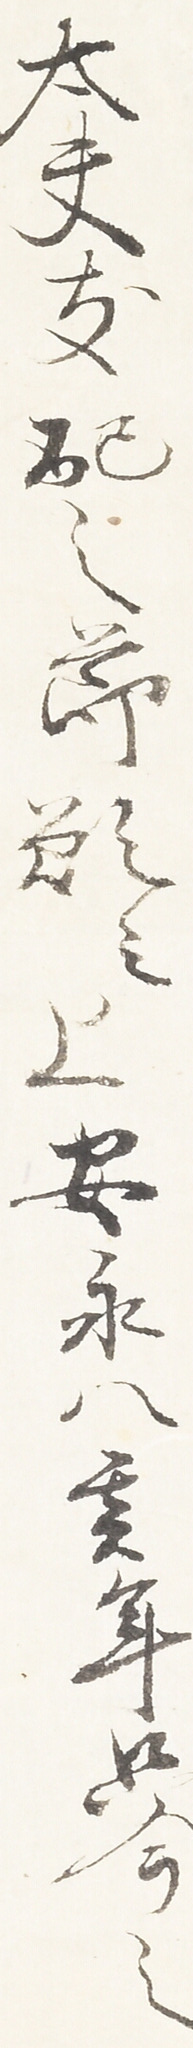太夫支配之節願之上安永八亥年只今之
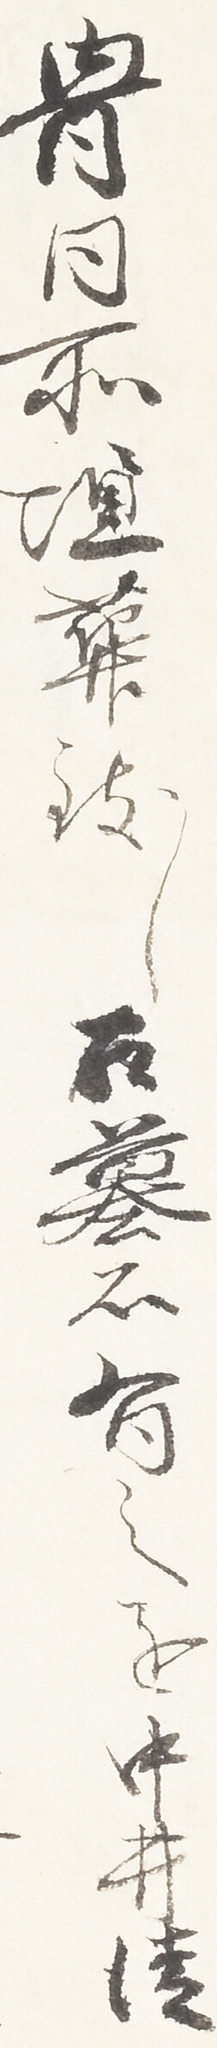骨同所ニ埋葬致し古墓石有之を中井清
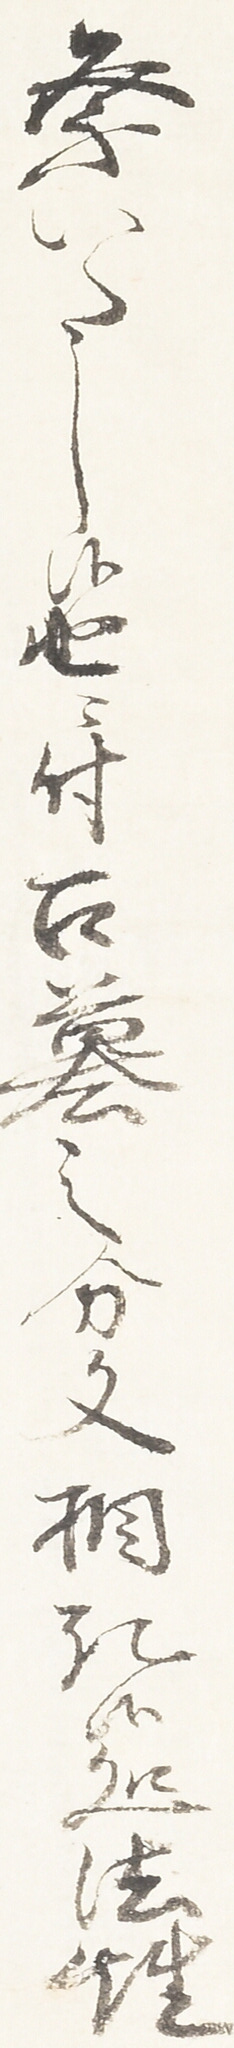祭いたし候由ニ付古墓之分文相糺候処法性
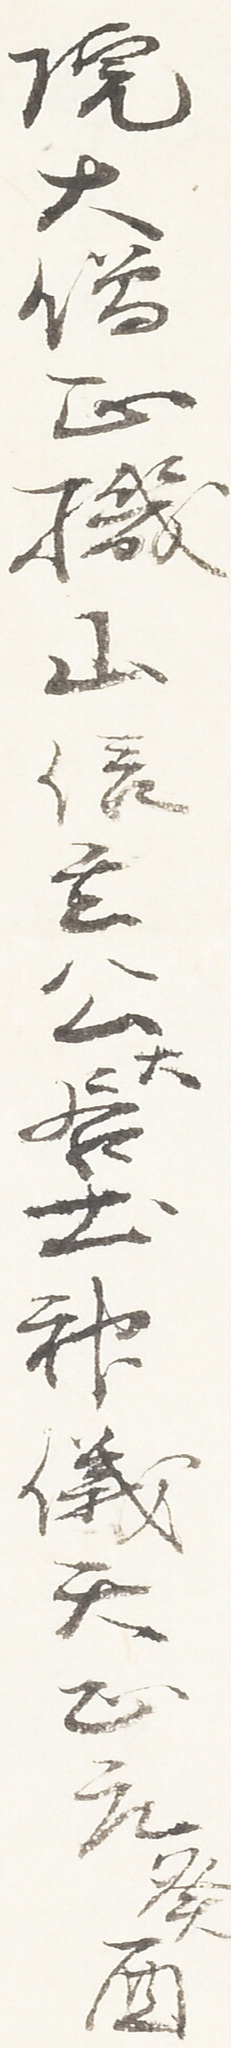院大僧正機山信玄公大居士神儀天正元癸酉
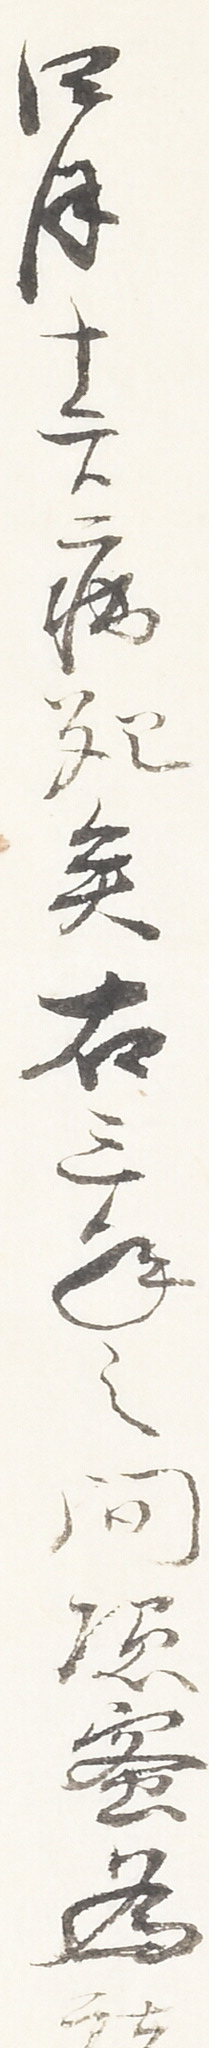四月十二日病死矣右三年之間隠蜜為諸
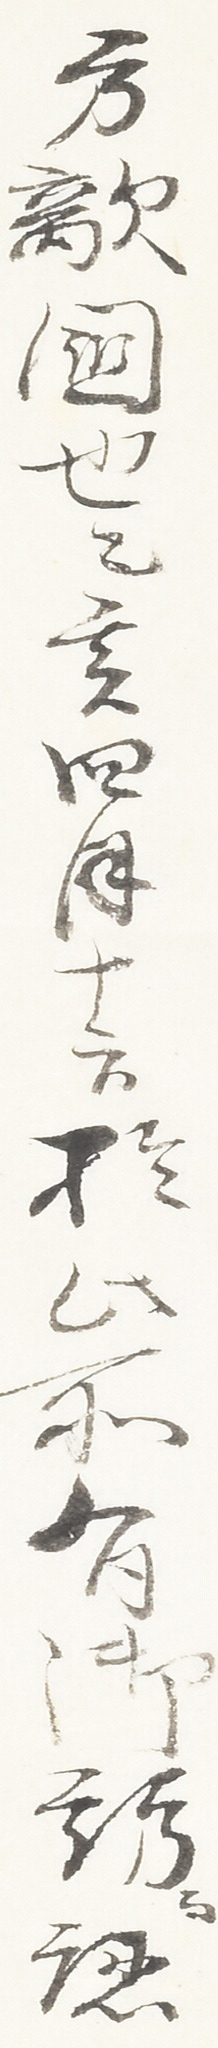方敵国也乙亥四月十二日於此所有御訪而認
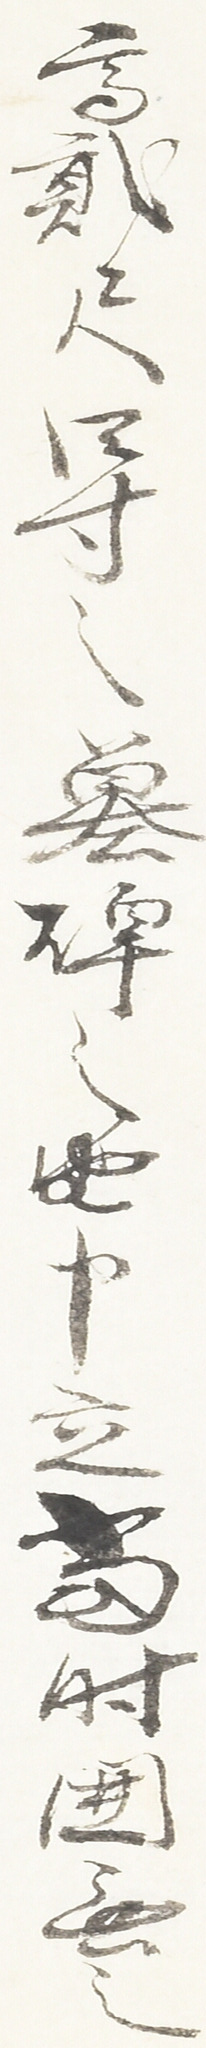高弐尺四寸之墓碑之由申立当時囲無之
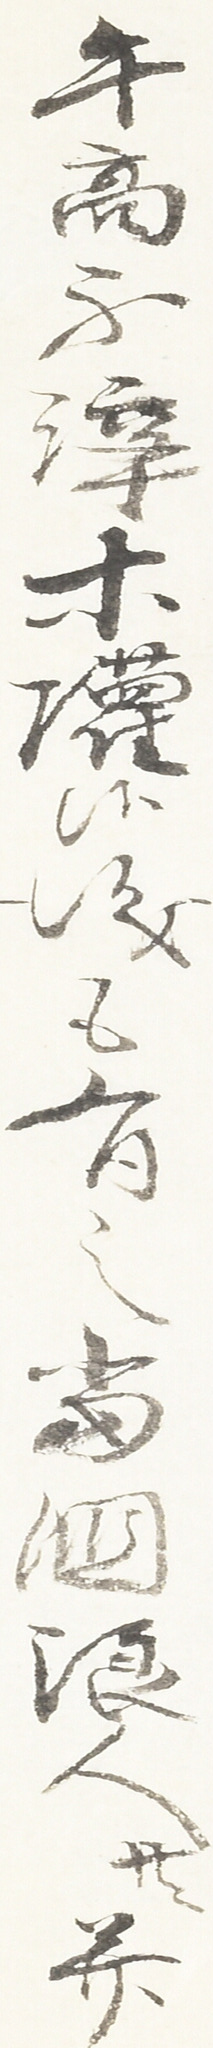午高不浄等灌候儀も有之当国浪人共并
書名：岩窪廟取（所）墓碑囲石垣取建伺書
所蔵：伊那市立高遠町図書館・合同会社AMANE
